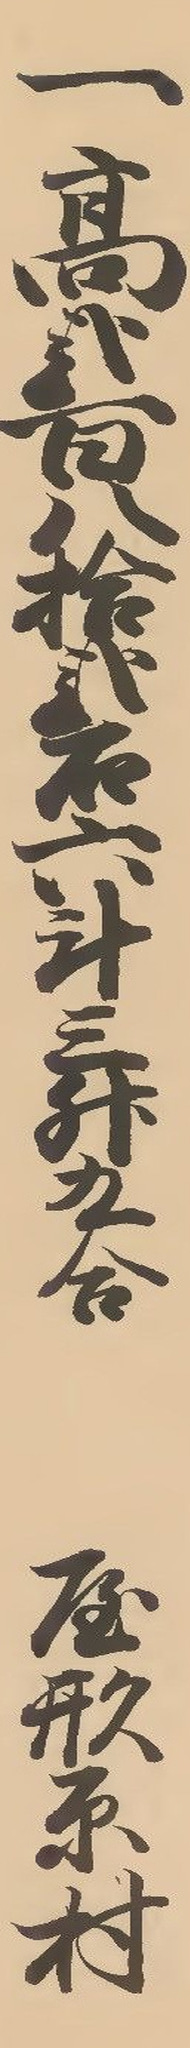一髙弐百八拾弐石六斗三升九合屋形原村
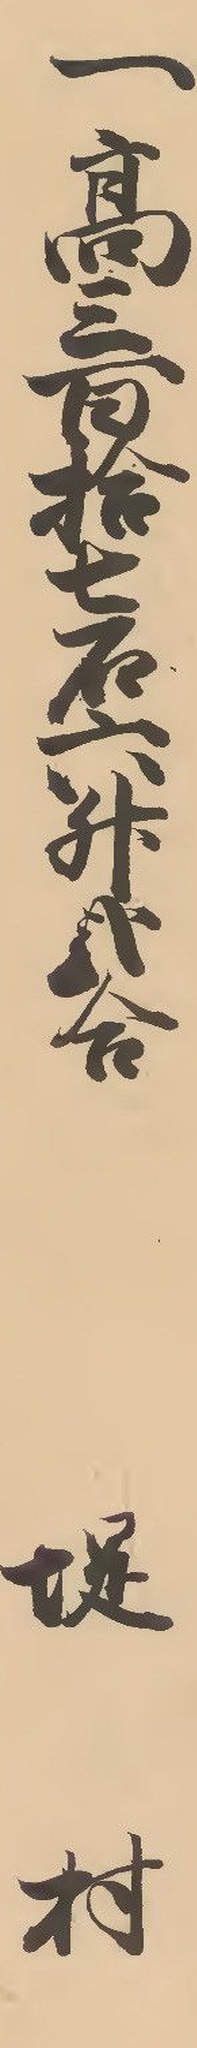一髙三百拾七石六升弐合堤村

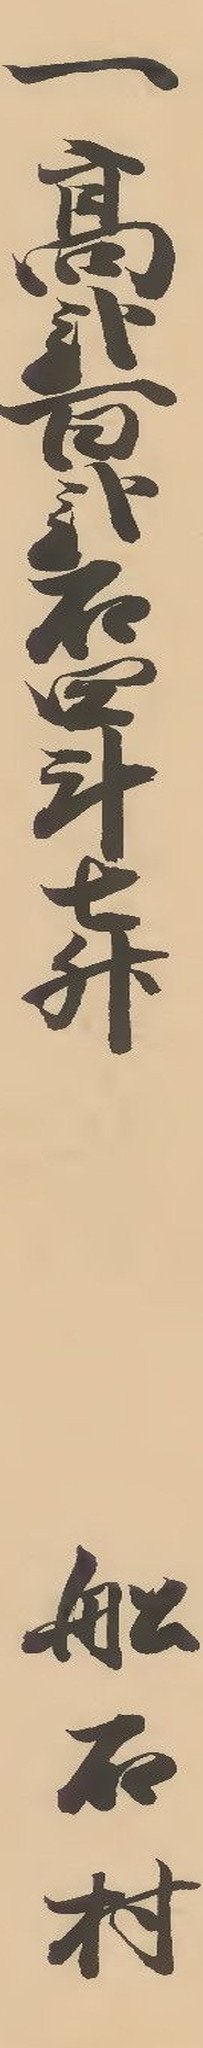一高弐百弐石四斗七升船石村
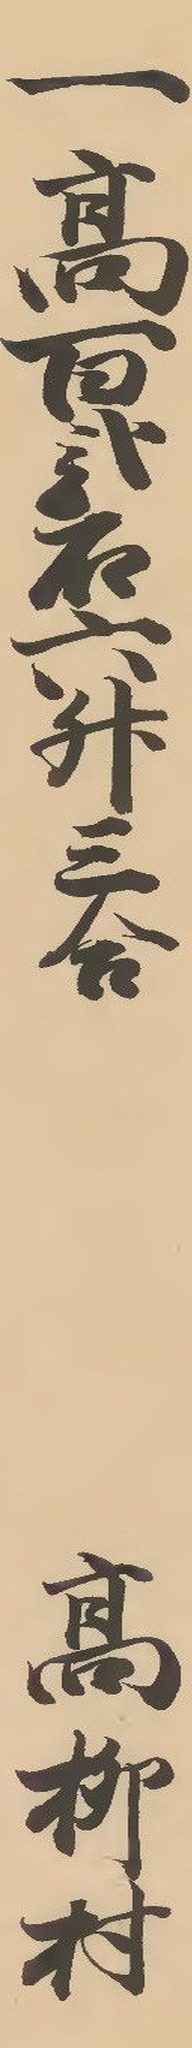一高百弐石六升三合高柳村
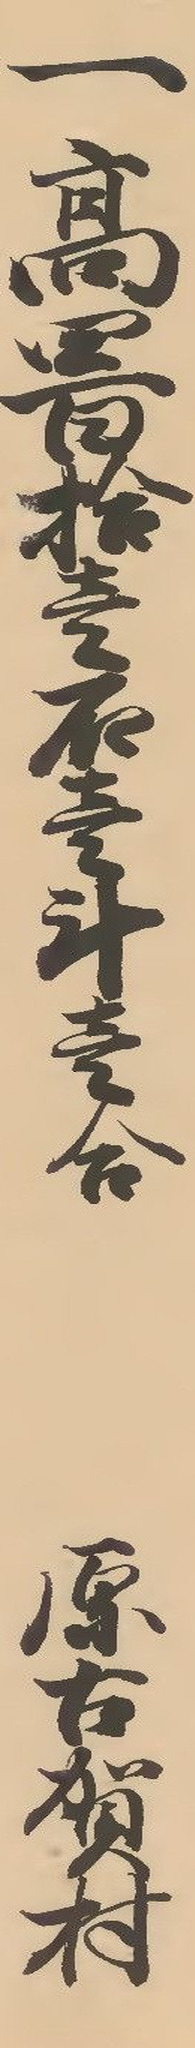一高四百拾壱石壱斗壱合原古賀村
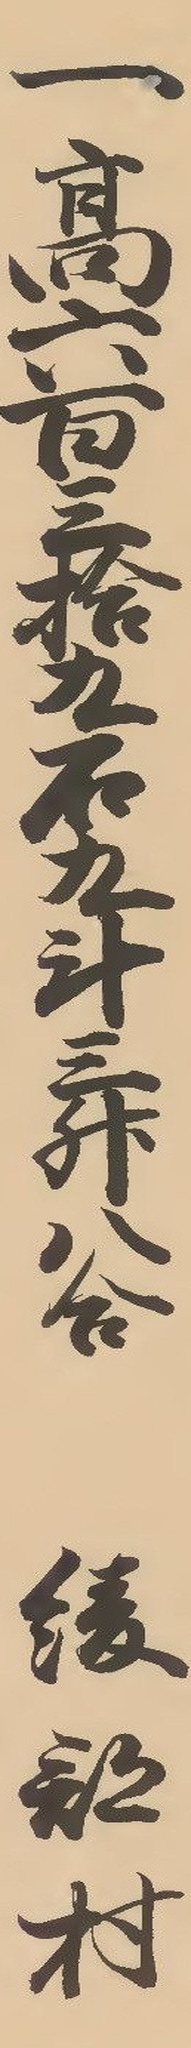一高六百三拾九石九斗三升八合綾部村
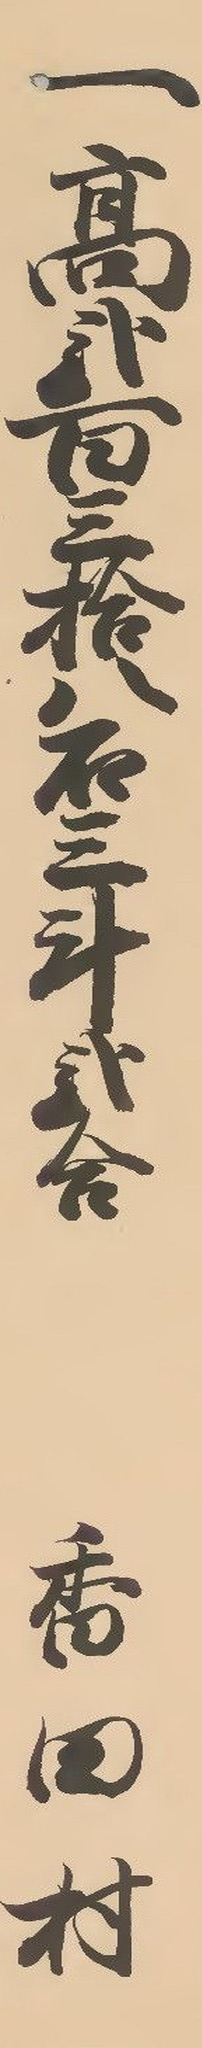一高弐百三拾八石三斗弐合香田村
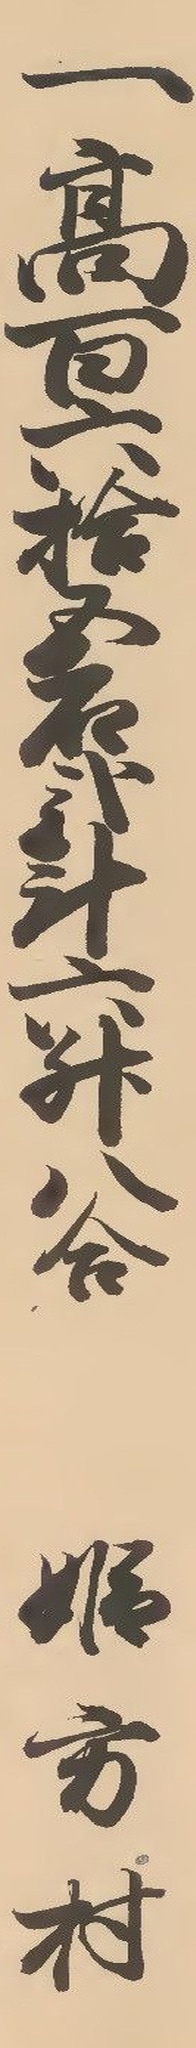一高百六拾五石弐斗六升八合姫方村
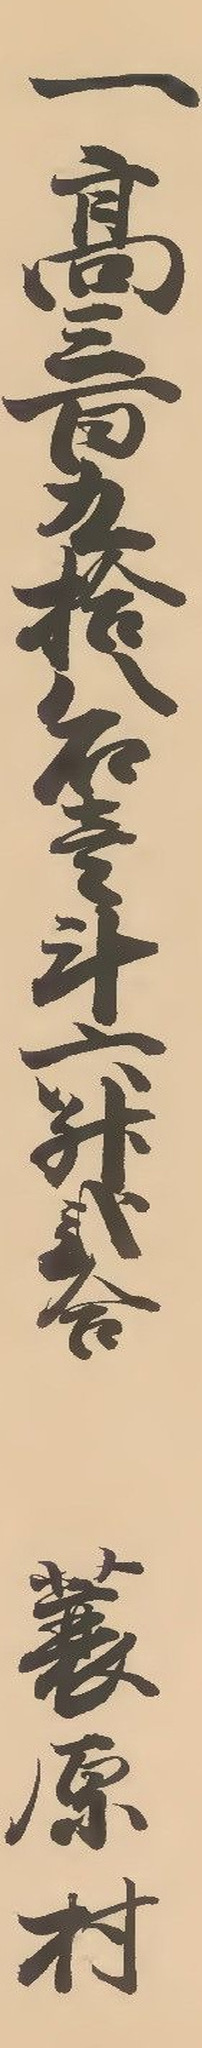一高三百九拾八石壱斗六升弐合蓑原村
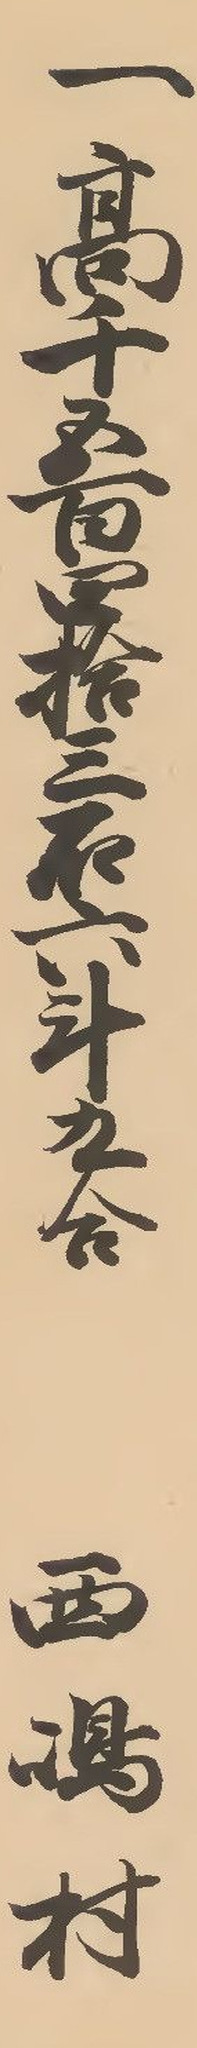一高千五百四拾三石六斗九合西島村

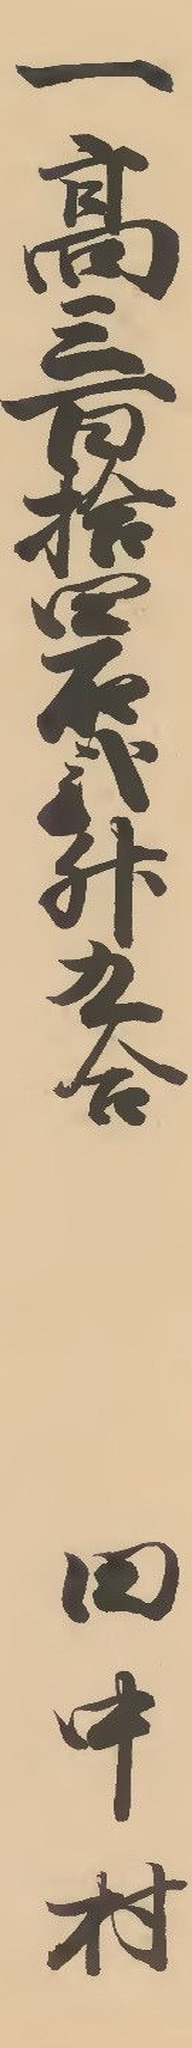一髙三百拾四石弐升九合田中村
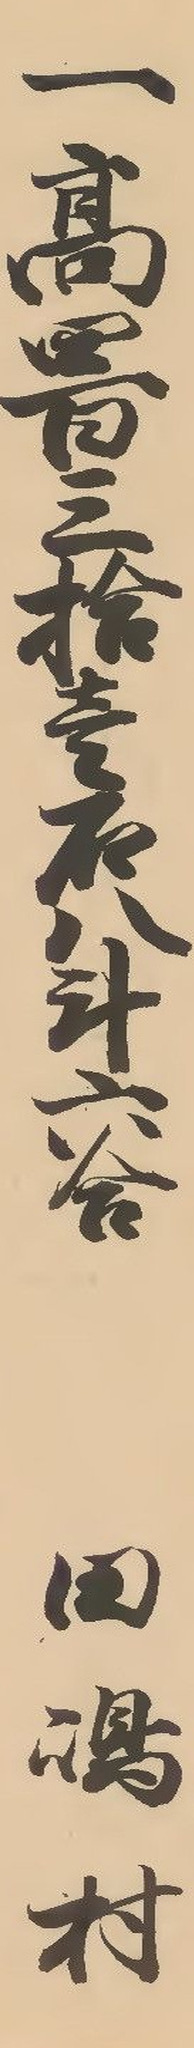一髙四百三拾壱石八斗六合田嶋村
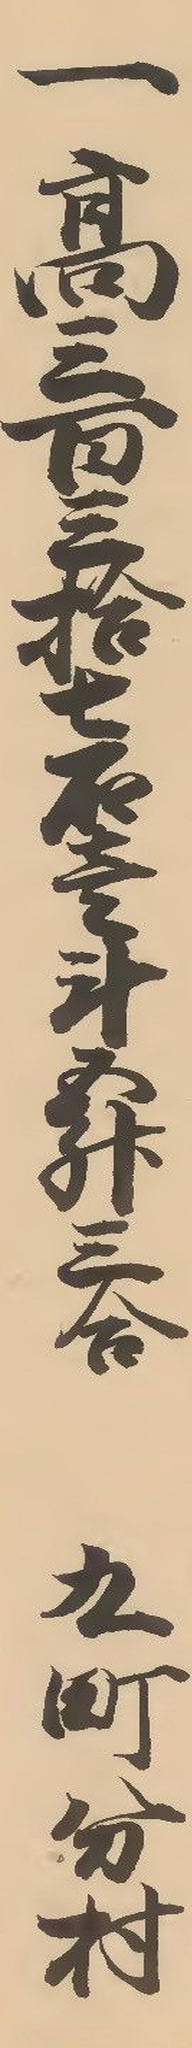一髙三百三拾七石壱斗五升三合九町分村
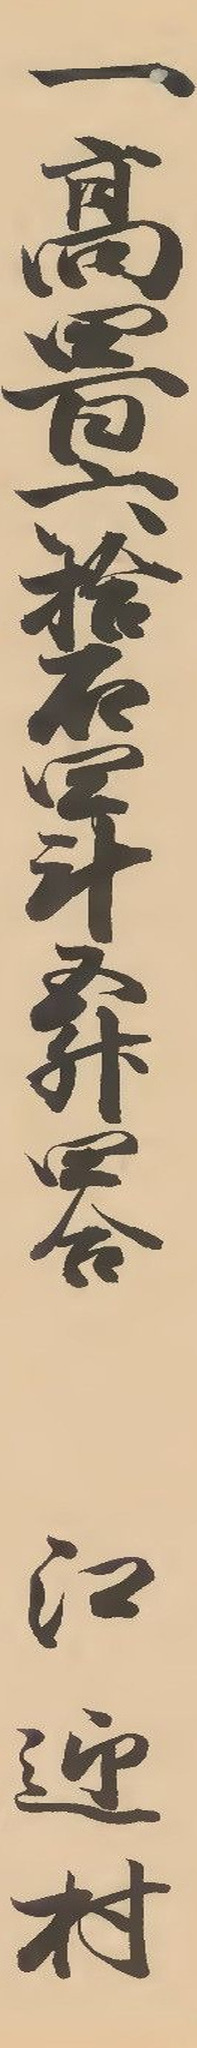一髙四百六拾石四斗五升四合江迎村
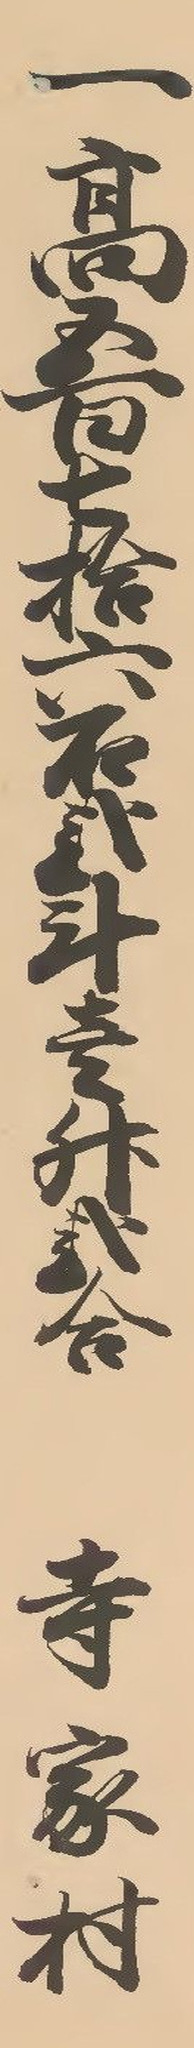一髙五百七拾六石弐斗壱升弐合寺家村
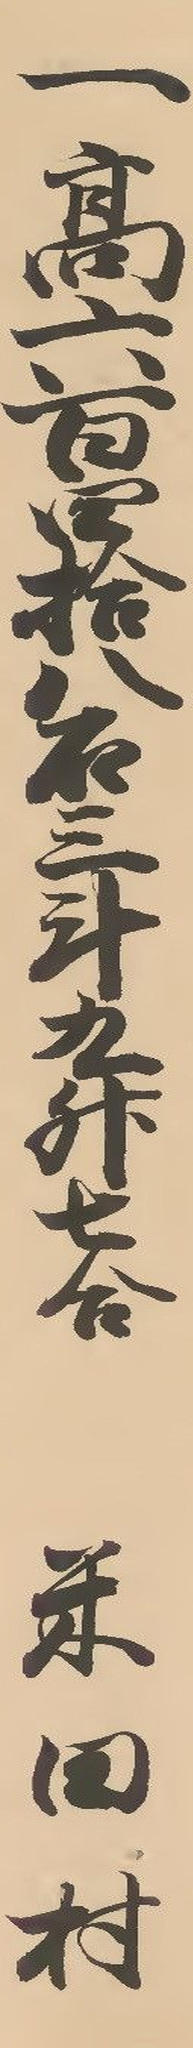一髙六百四拾八石三斗九升七合米田村
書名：肥前国郷帳
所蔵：国立公文書館 National Archives of Japan
